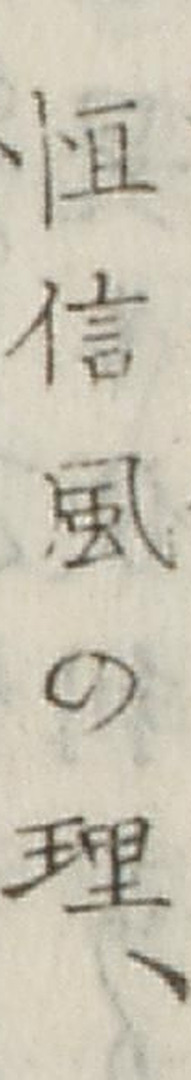恒信風の理、
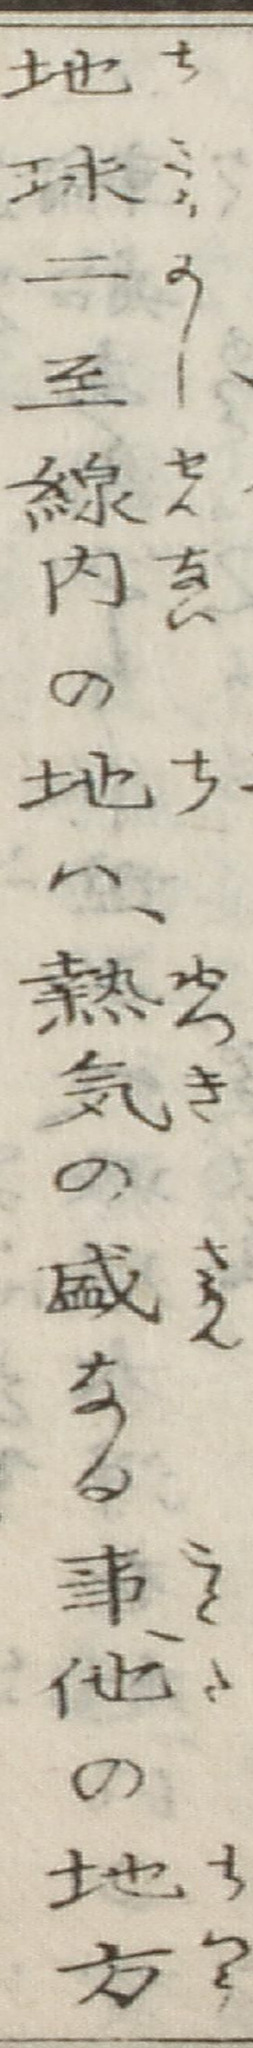地球二至線内の地は、熱気の盛なる事、他の地方
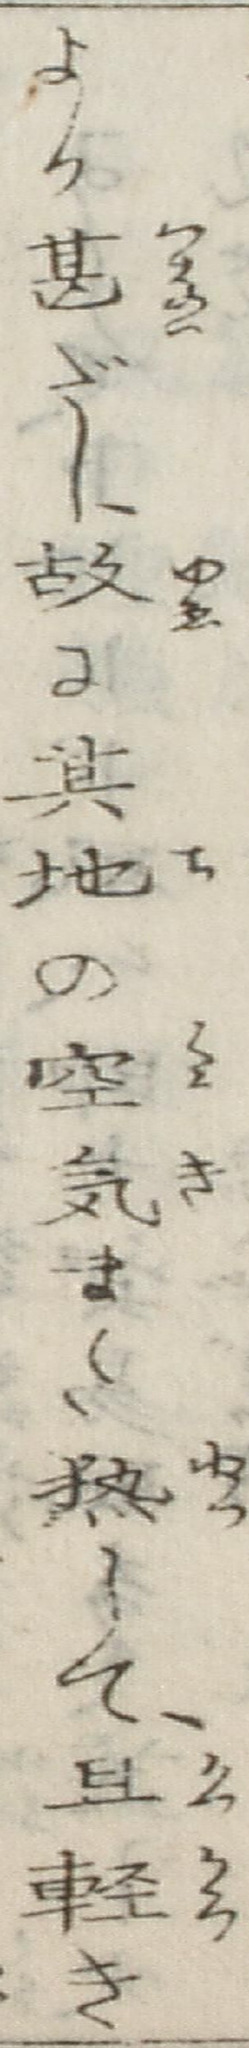より甚だし、故に其地の空気また熱して、且軽き
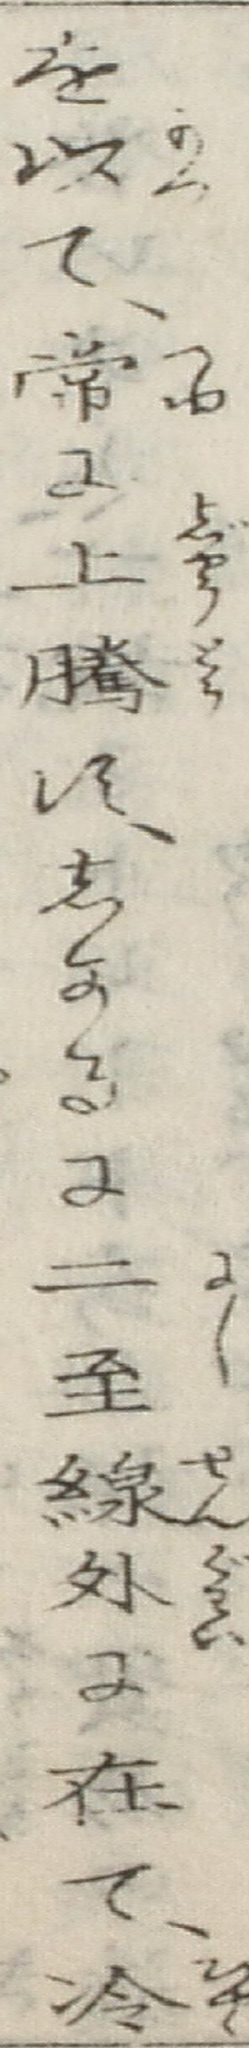を以て、常に上騰す、しかるに二至線外に在て、冷
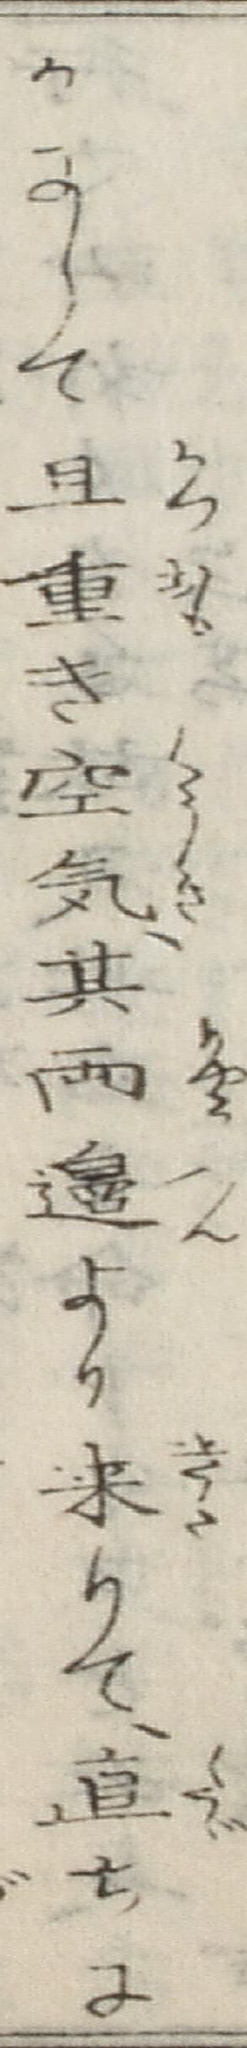かにして且重き空気、其両辺より来りて、直ちに
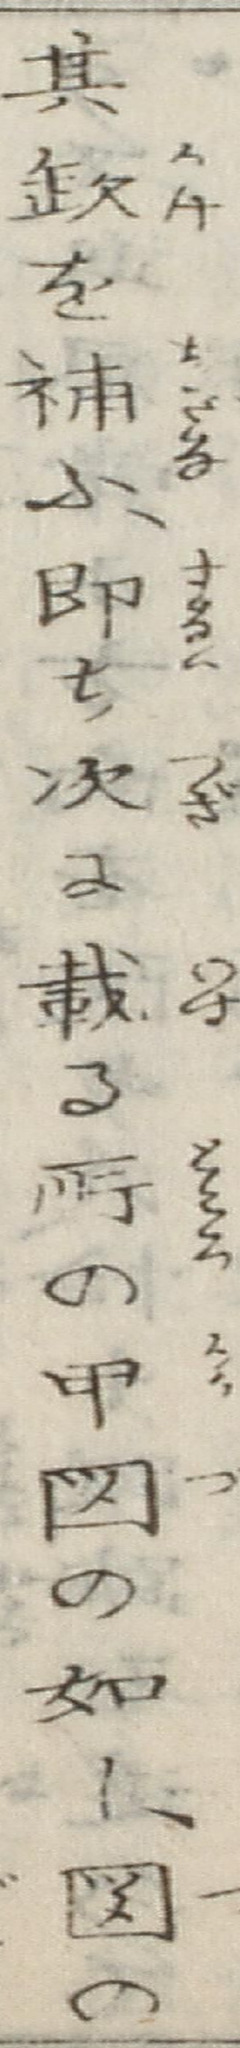其欫を補ふ、即ち次に載る所の甲図の如し、図の
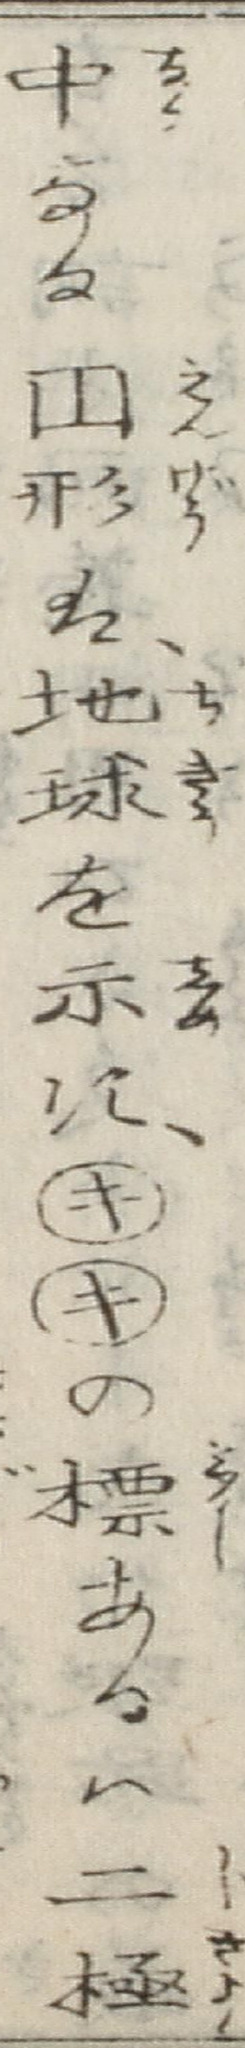中なる円形は、地球を示す、キキの標あるは二極

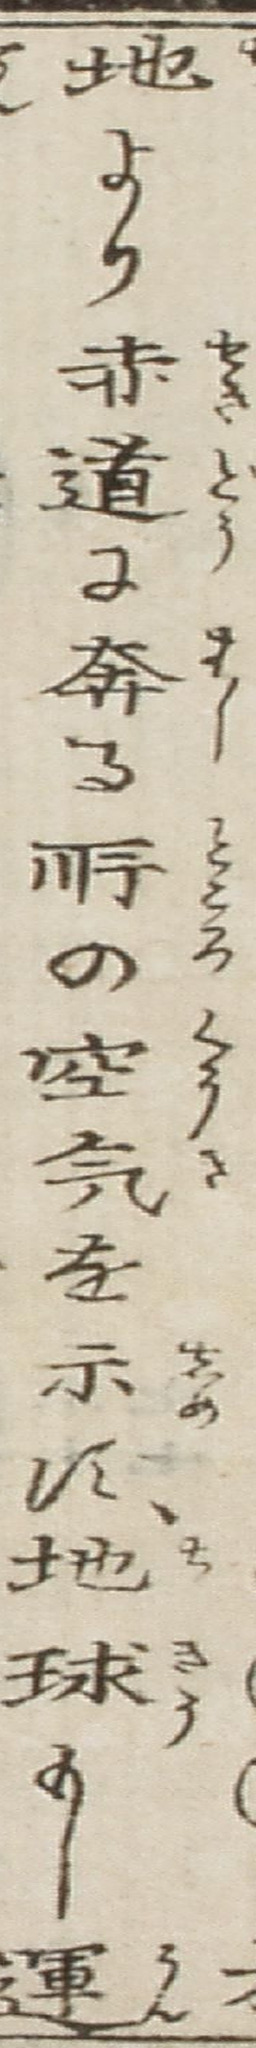地より赤道に奔る所の空気を示す、地球もし運
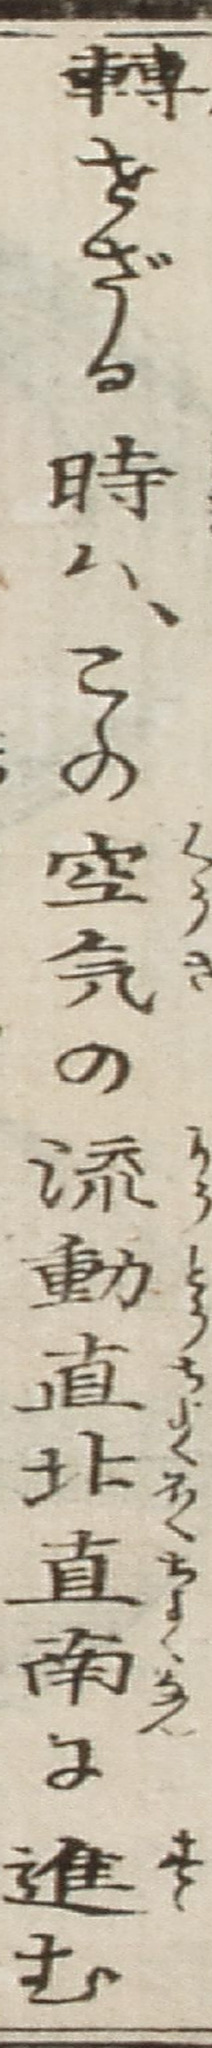転せざる時は、この空気の流動直北直南に進む
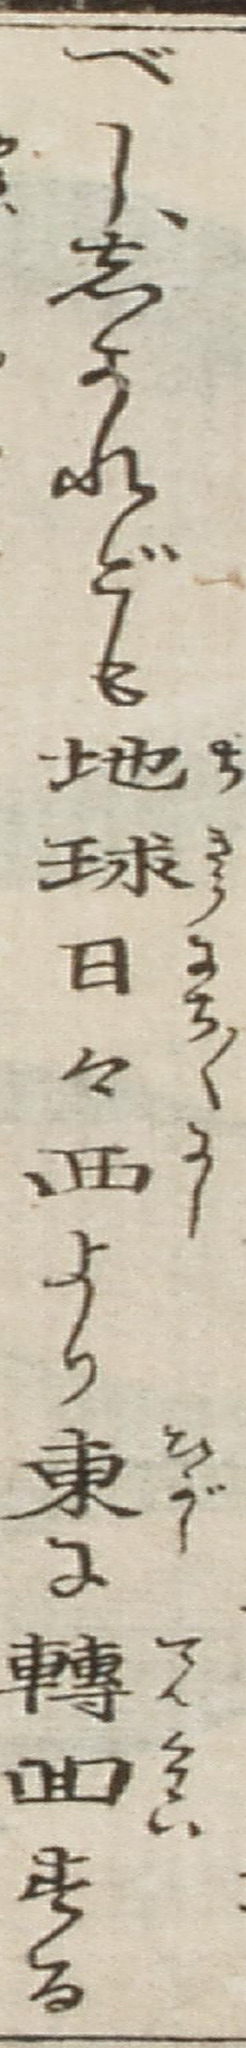べし、しかれども地球日々西より東に転回する
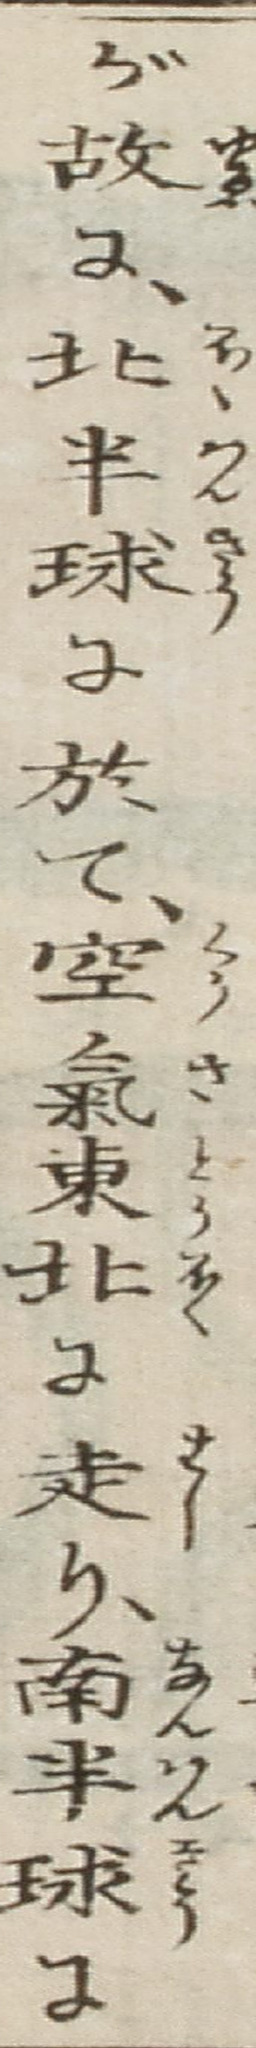が故に、北半球に於て、空気東北に走り、南半球に
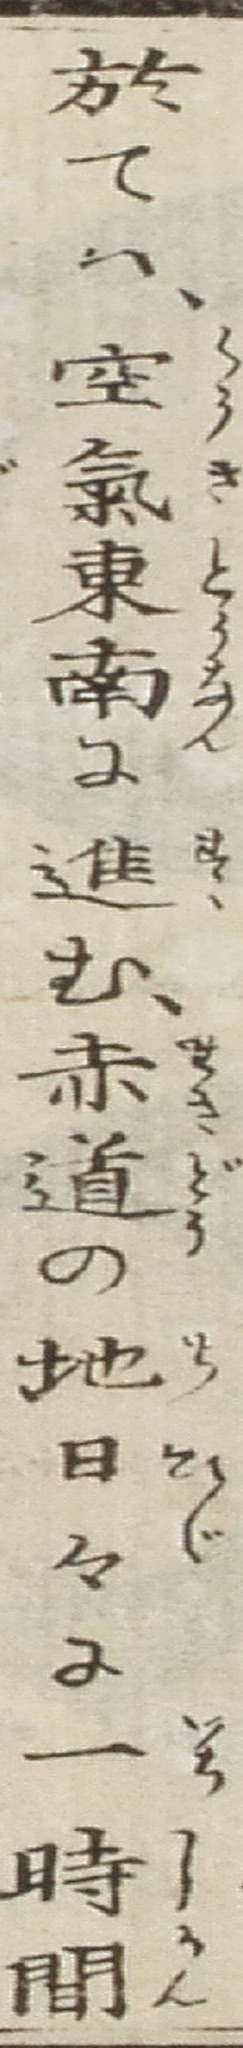於ては、空気東南に進む、赤道の地日々に一時間
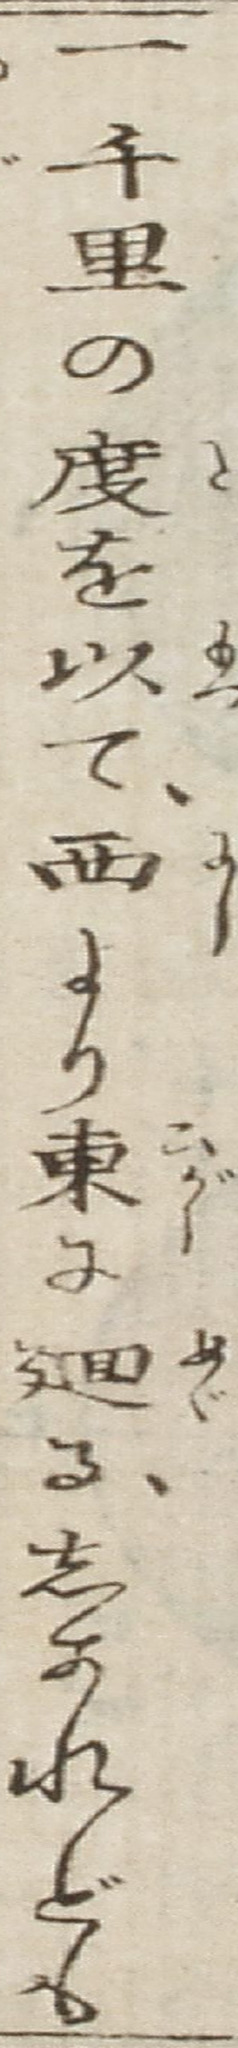一千里の度を以て、西より東に迴る、しかれども
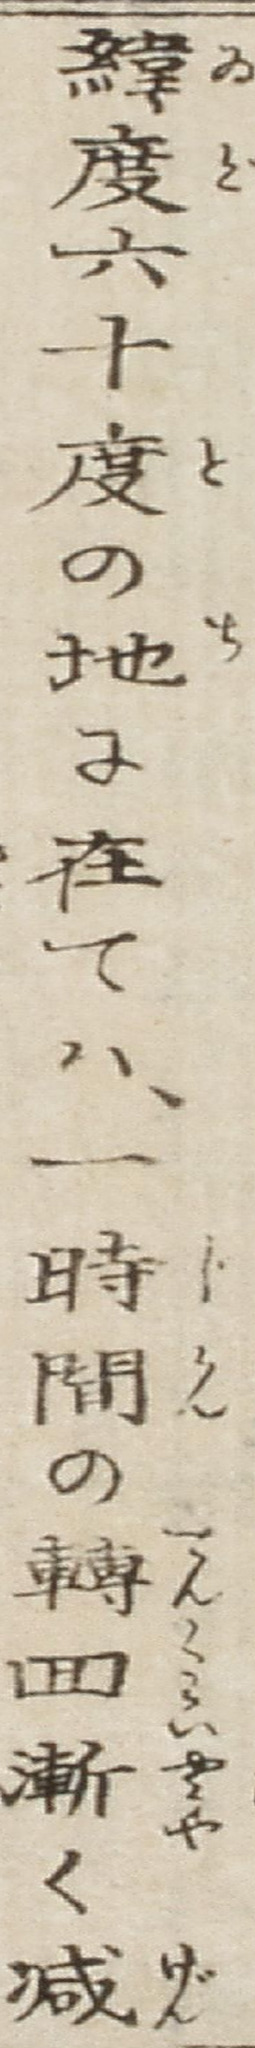緯度六十度の地に在ては、一時間の転回漸く減
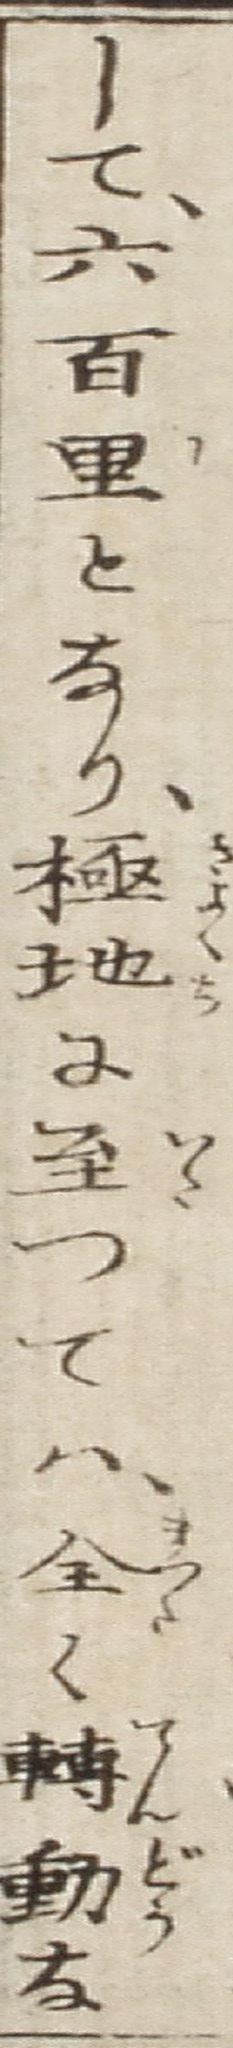して、六百里となり、極地に至つては、全く転動な
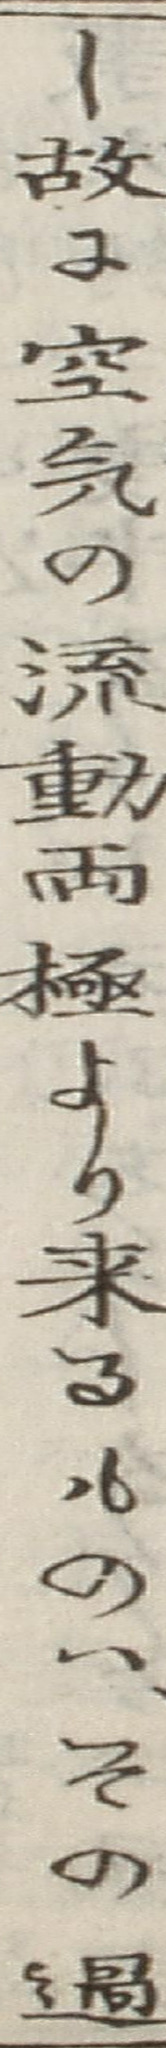し故に空気の流動両極より来るものは、その過
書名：訓蒙　天然地理學　中
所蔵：東京大学地震研究所図書室 Earthquake Research Institute Library, The University of Tokyo, JAPAN
